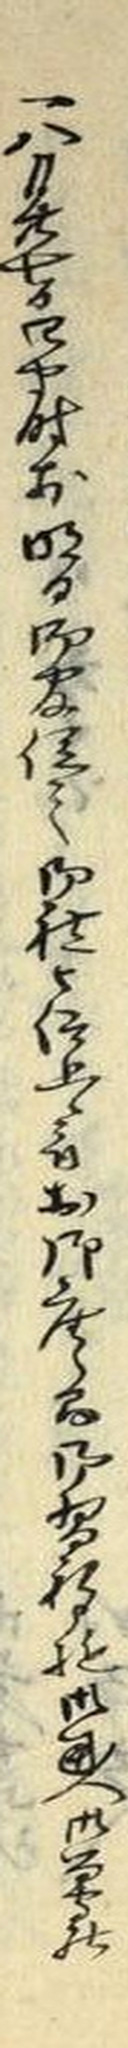一八月廿七日四半時前明日御官位之御礼被仰上候ニ付於御座之間御習礼被遊御用人御留守居
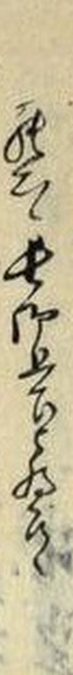罷出候長御上下被為召候
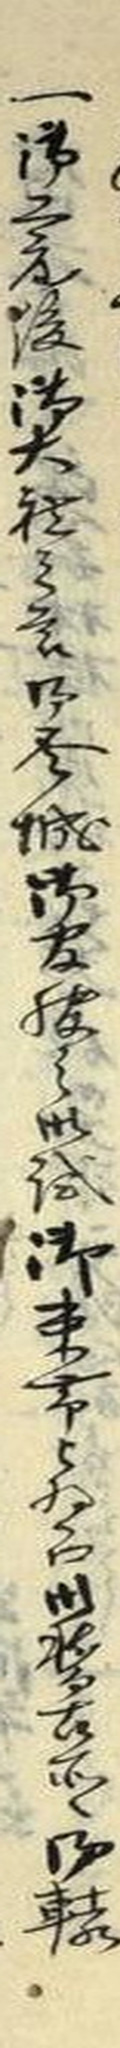一御二度後御大礼之節御登城御官服之御試御束帯被為召御稽古所へ御轅
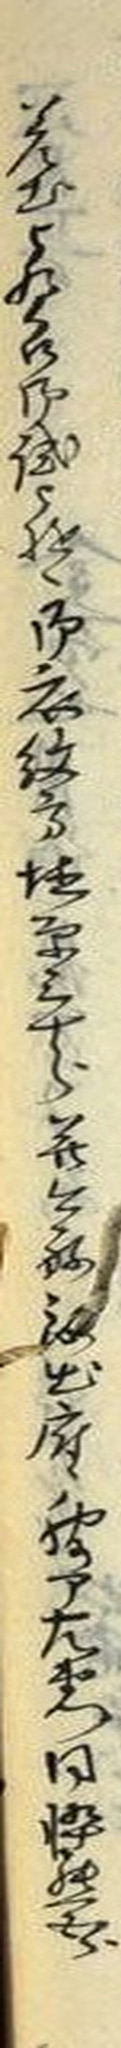差出被為召御試被遊候御衣紋方埴原三十郎幷今般致出府候服部左衛門同忰熊五郎
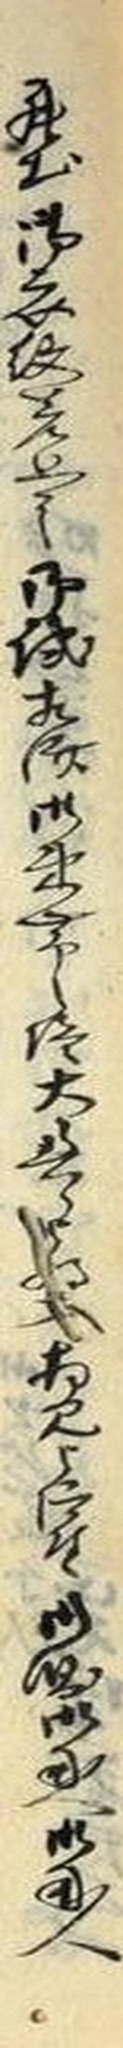罷出御衣紋差上之御試相済御束帯之儘大奥へ被為入拝見被仰付候御側御用人御用人
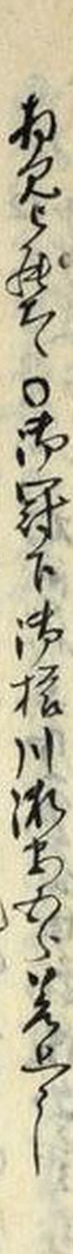拝見被罷出候〇御冠下御櫛川瀬安五郎差上之
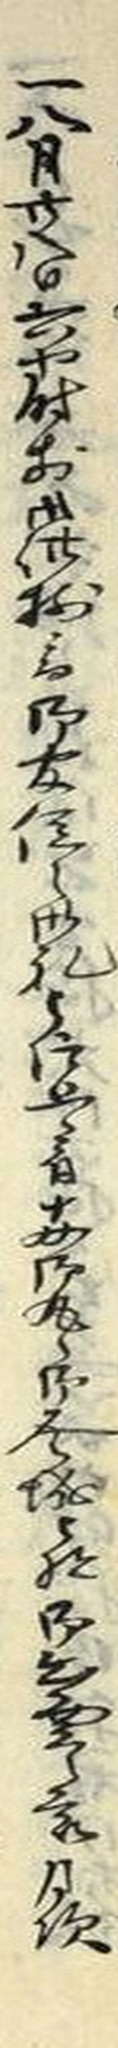一八月廿八日六半時前御供揃ニ而御官位之御礼被仰上候ニ付両御丸へ御登城被遊御出殿之節月次
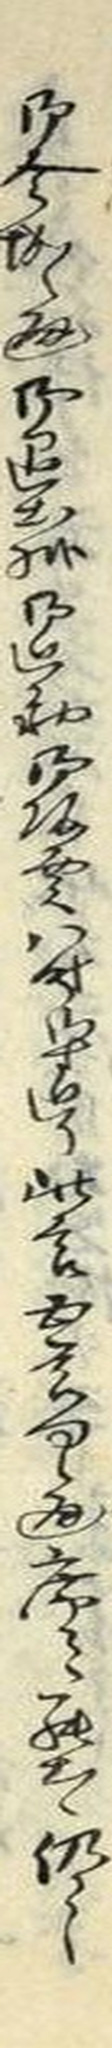御登城之通御退出掛御廻勤御帰殿八時弐寸廻り此節五節句之通席々へ罷出候仍之
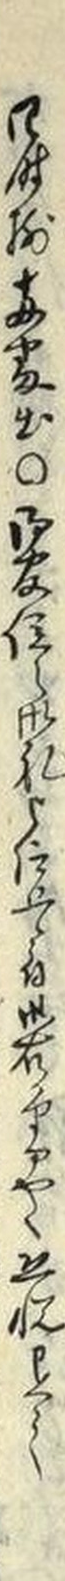四時揃両番出〇御官位之御礼被仰上候ニ付御右筆部屋へ恐悦申上之
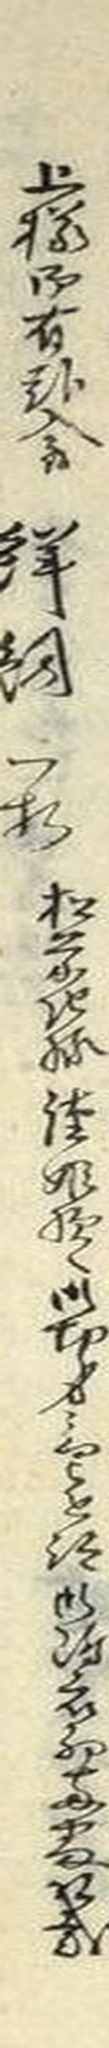上様御有卦入ニ付鮮鯛一折松栄院様謹姫様へ御切身ニ而被進跡御附衆初両番頂戴
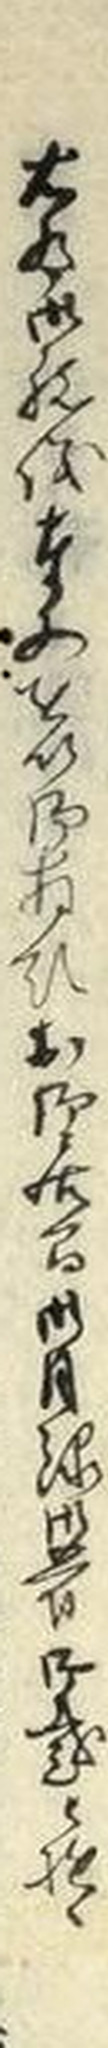右為御祝儀奉文を以御拝領於御居間御目録御肴御戴被遊候
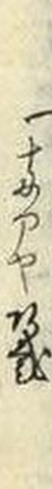両部屋頂戴
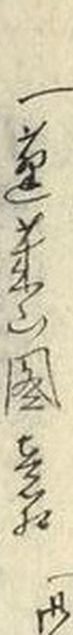蓬莱山図壱箱
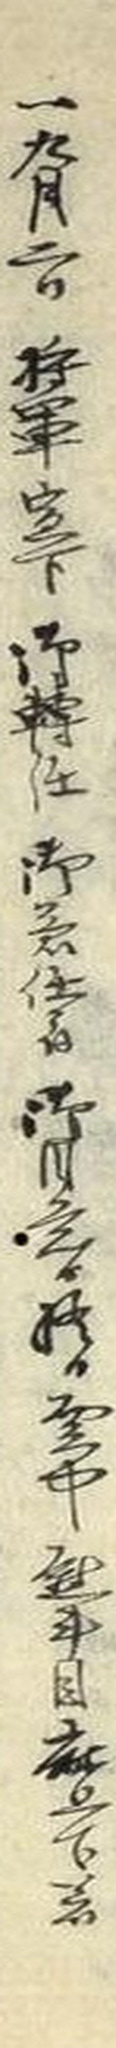一九月二日将軍宣下御転任御兼任ニ付御目覚ゟ終日殿中熨斗目麻上下着
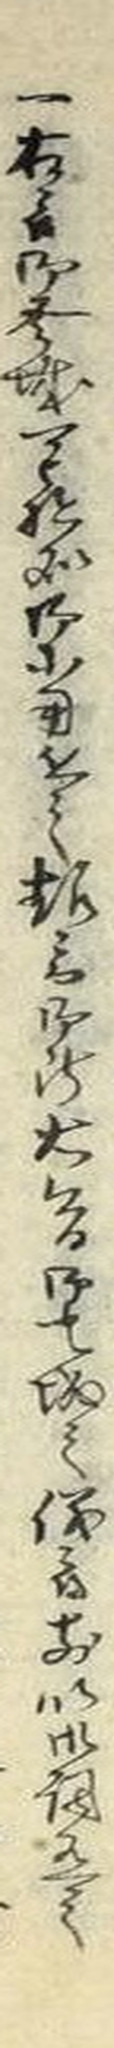一右ニ付御登城可被遊処御小用近之趣ニ而御断右今日御登城之儀ニ付前以御伺有之
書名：少傅日録抄（斉善付側向頭取日記、在府）
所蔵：福井県文書館 Fukui Prefectural Archives
